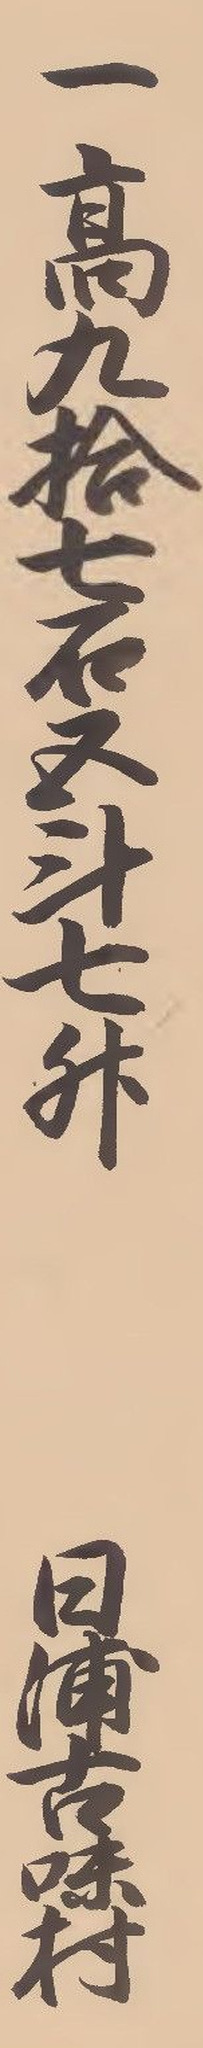一髙九拾七石五斗七升日浦古味村
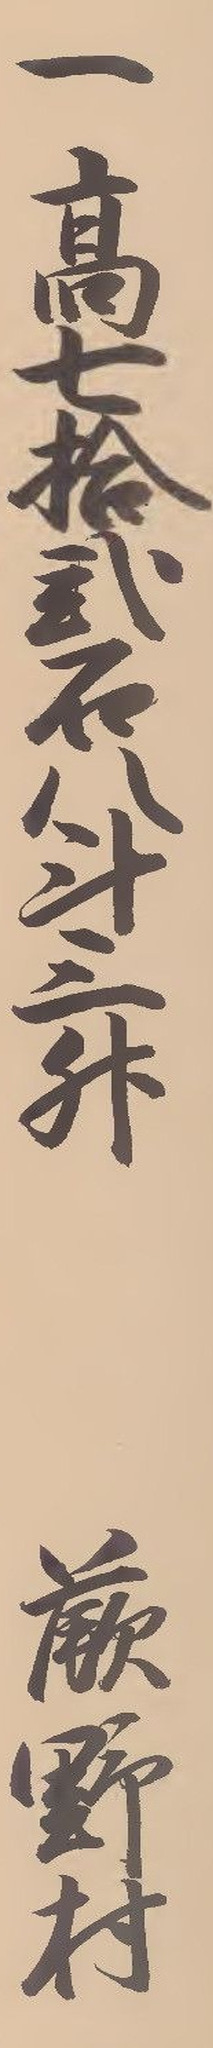一髙七拾弐石八斗三升蕨野村
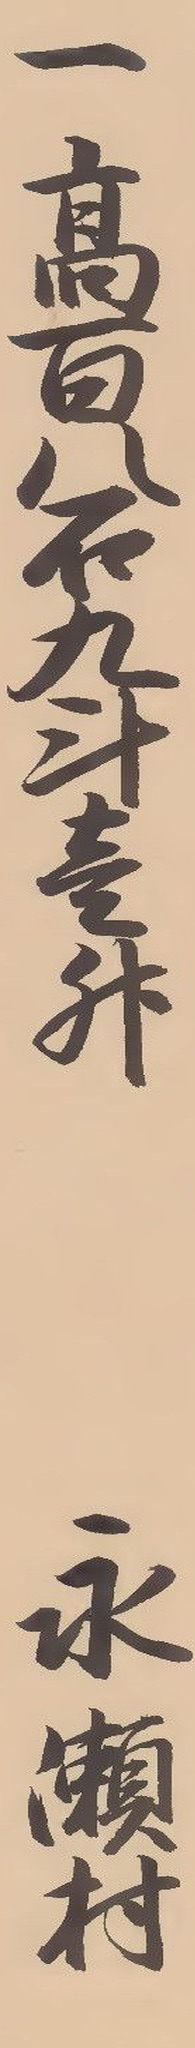一髙百八石九斗壱升永瀬村
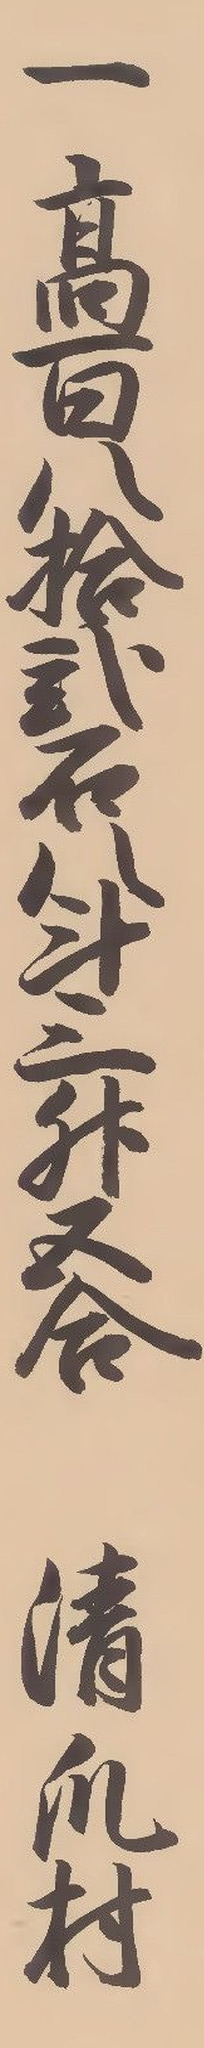一髙百八拾弐石八斗三升五合清爪村
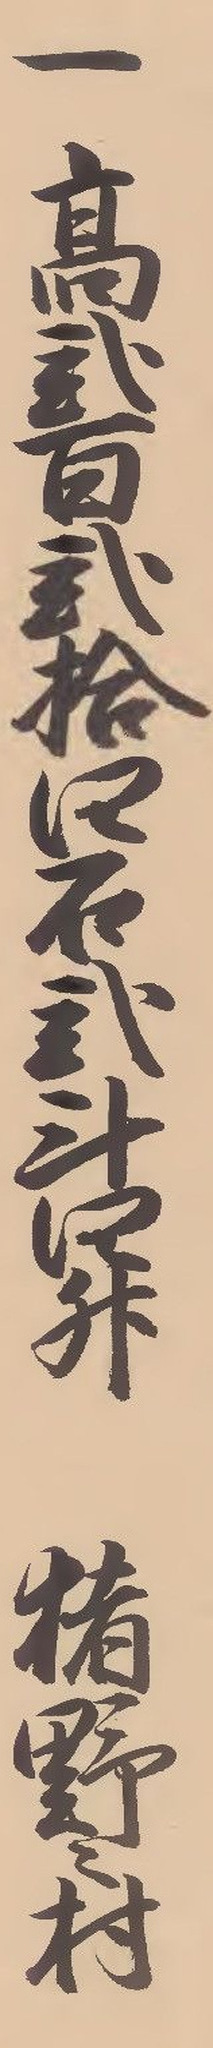一髙弐百弐拾四石弐斗四升猪野之村

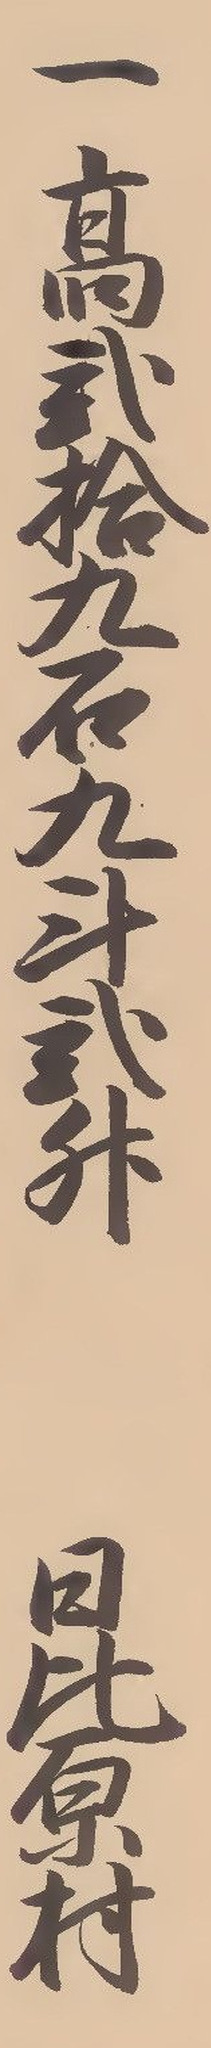一髙弐拾九石九斗弐升日比原村
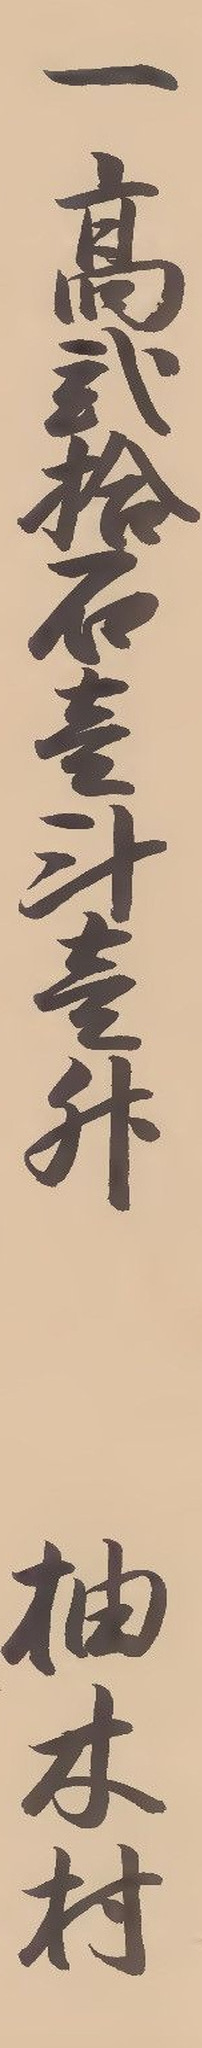一髙弐拾石壱斗壱升柚木村
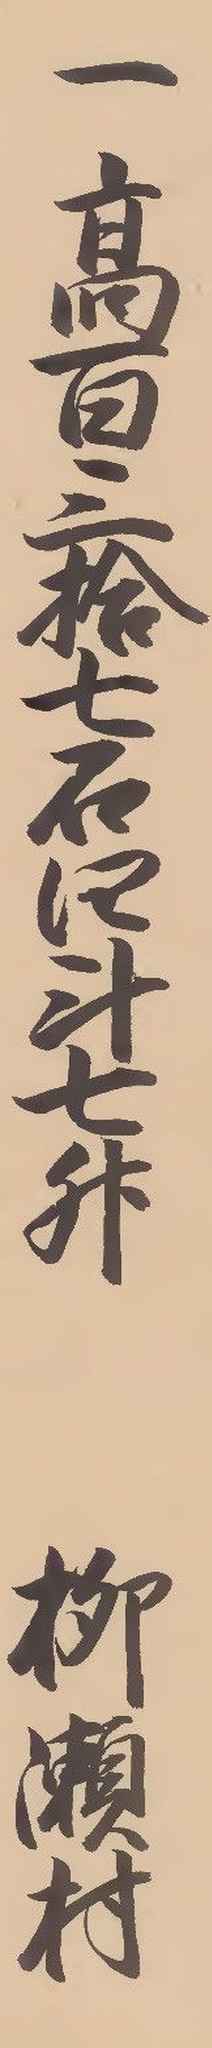一髙百三拾七石四斗七升柳瀬村
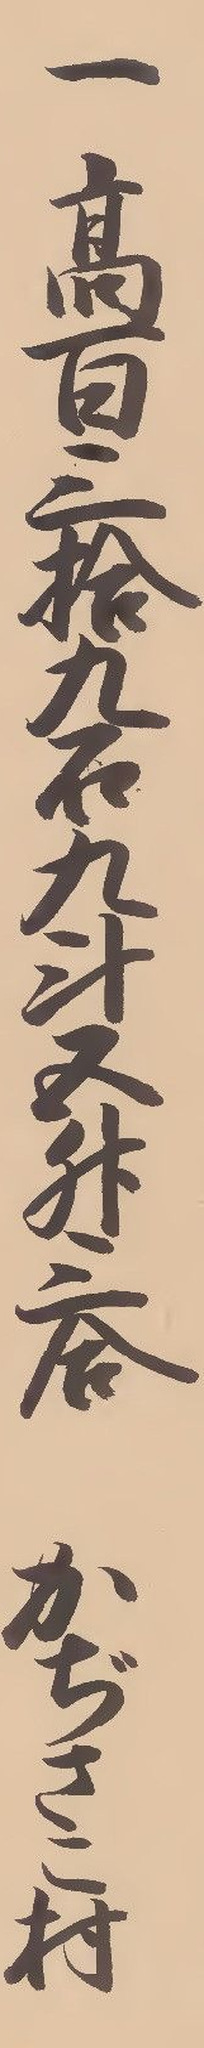一髙百三拾九石九斗五升三合かぢさこ村
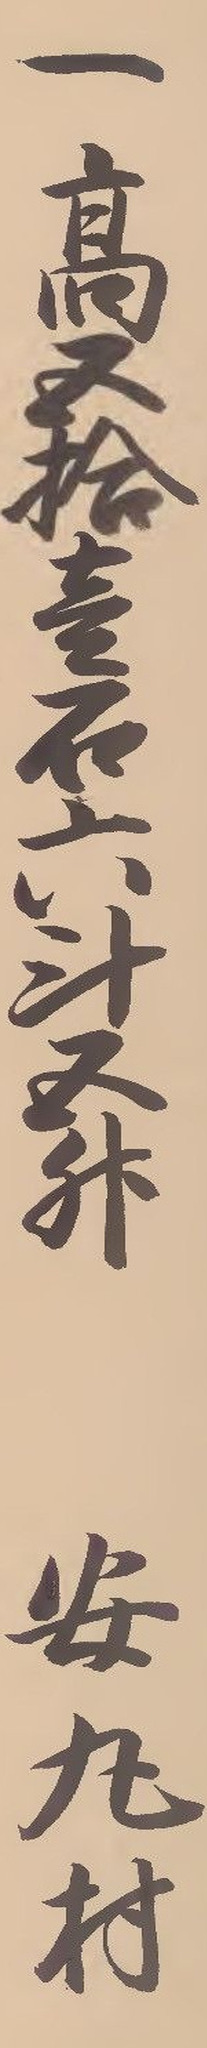一髙五拾壱石六斗五升安丸村
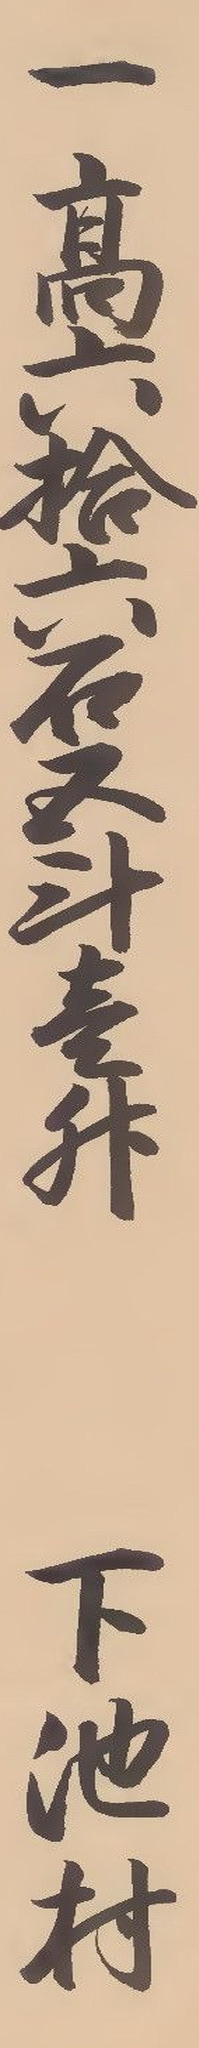一髙六拾六石五斗壱升下池村
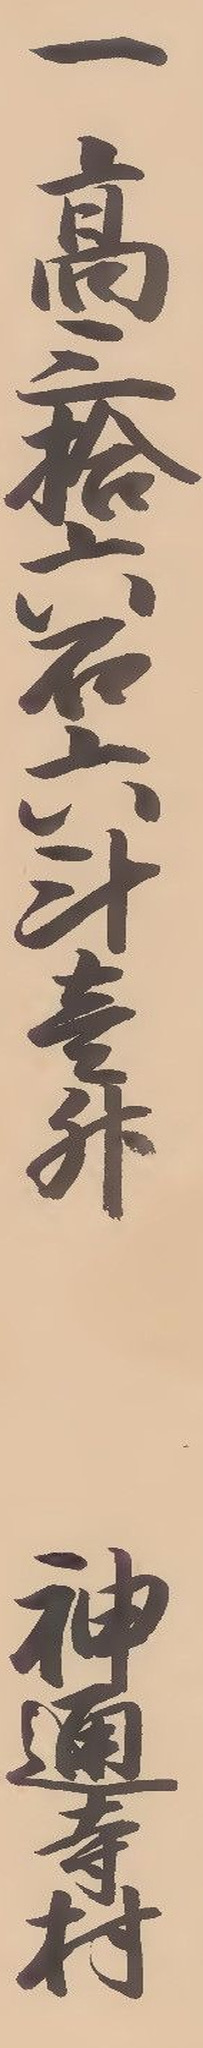一髙三拾六石六斗壱升神通寺村

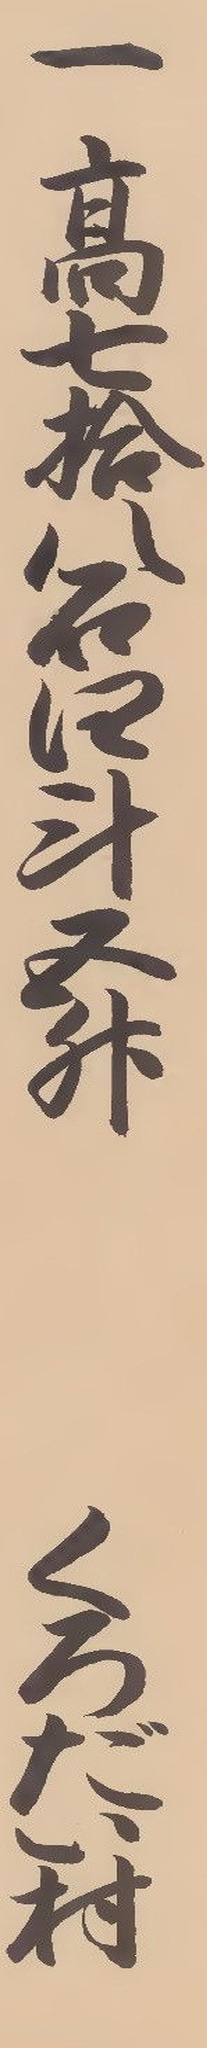一髙七拾八石四斗五升くろだい村
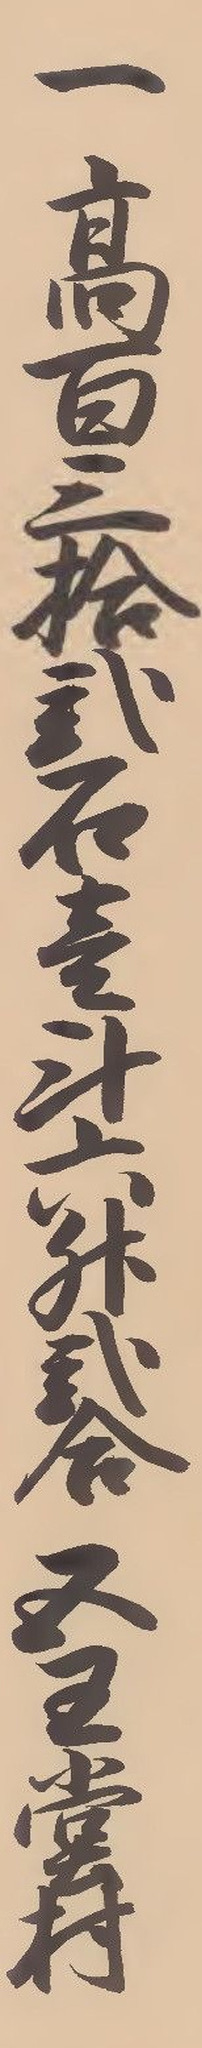一髙百三拾弐石壱斗六升弐合五王堂村
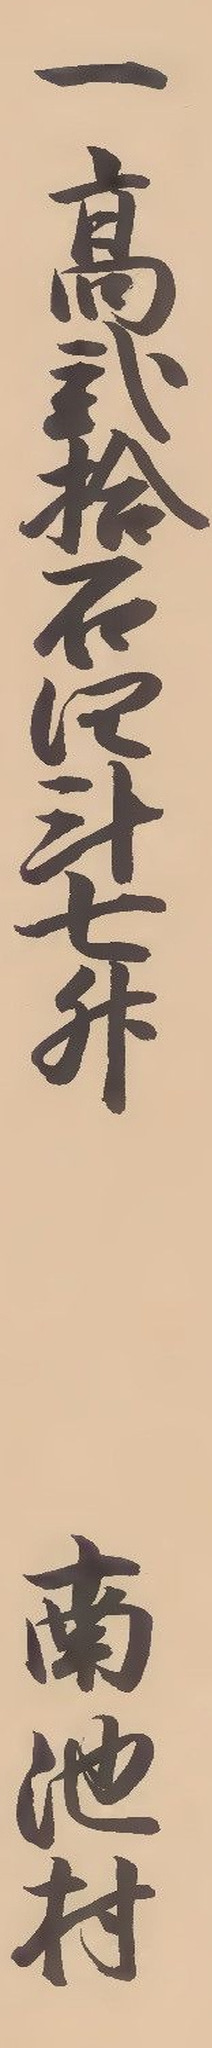一髙弐拾石四斗七升南池村
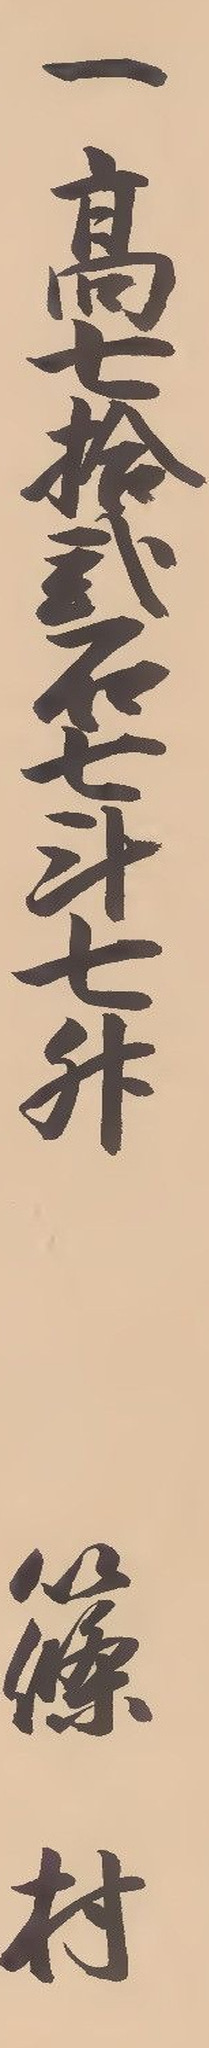一髙七拾弐石七斗七升篠村
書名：土佐国郷帳
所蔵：国立公文書館 National Archives of Japan
